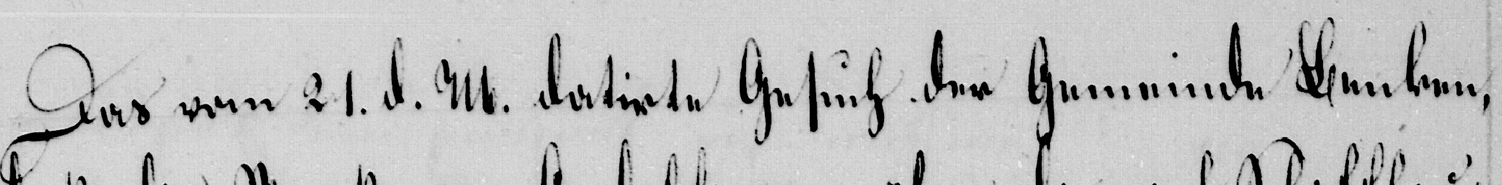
Das vom 21. d. M. datirte Gesuch der Gemeinde Benken,
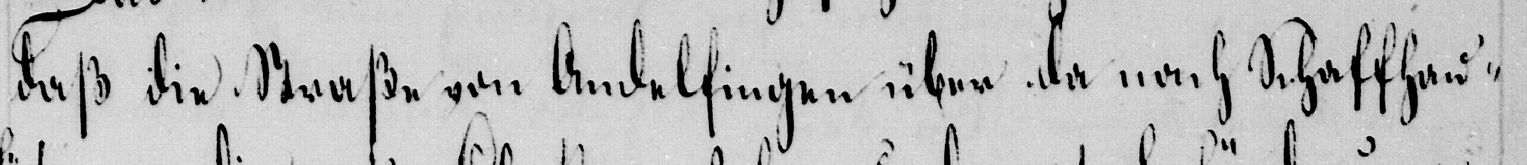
daß die Straße von Andelfingen über da nach Schaffhaus¬
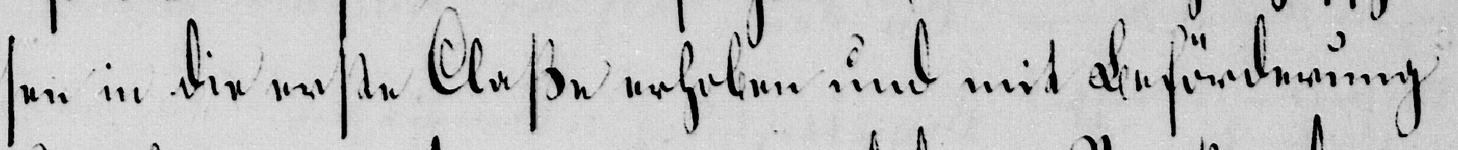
en in die erste Claße erhoben und mit Beförderung
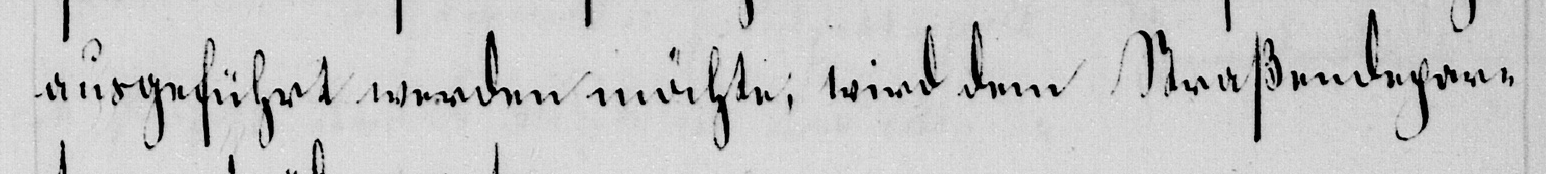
ausgeführt werden möchte, wird dem Straßendepar¬
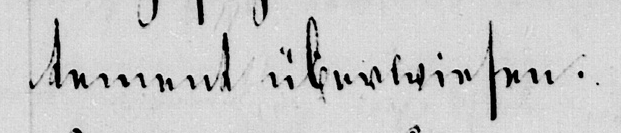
tement überwiesen.
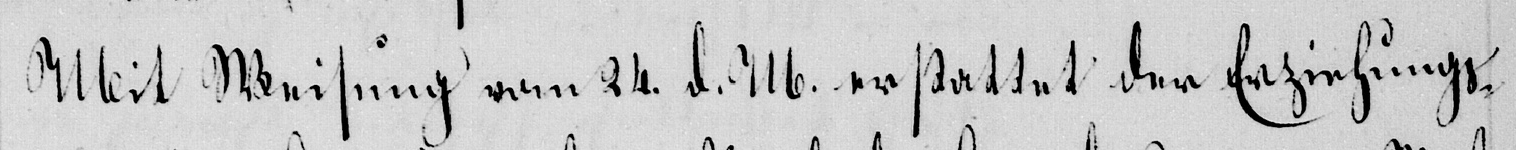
Mit Weisung vom 24. d. M. erstattet der Erziehungs¬
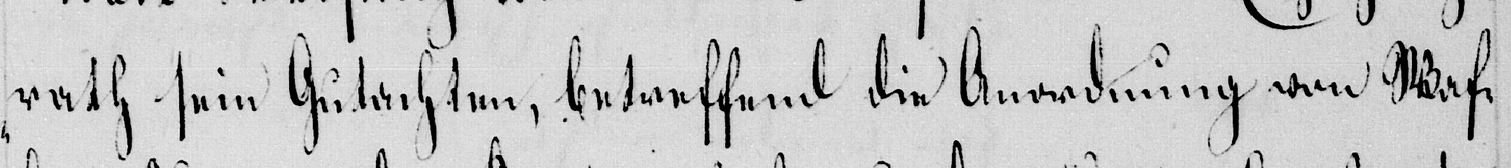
rath sein Gutachten, betreffend die Anordnung von Waf¬
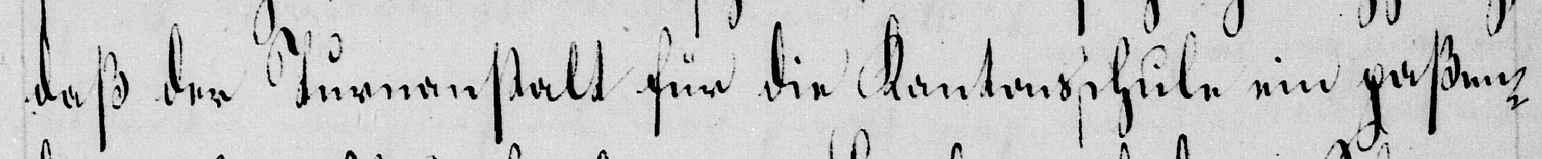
daß der Turnanstalt für die Kantonsschule ein paßen¬
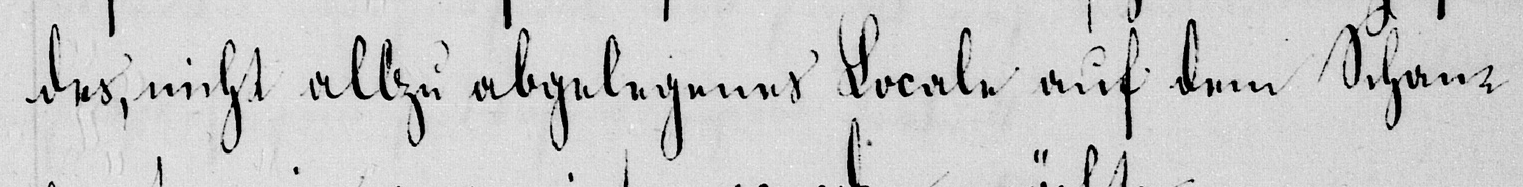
des, nicht allzu abgelegenes Locale auf dem Schan¬
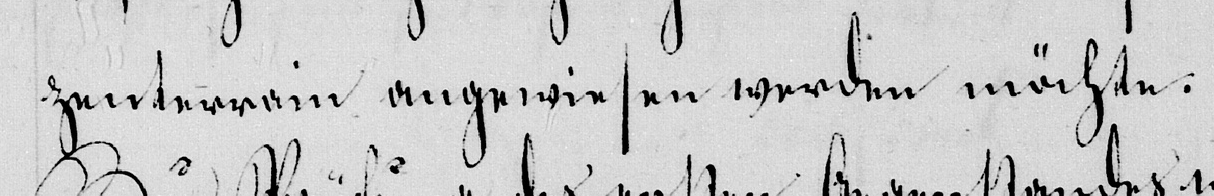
zenterrain angewiesen werden möchte.
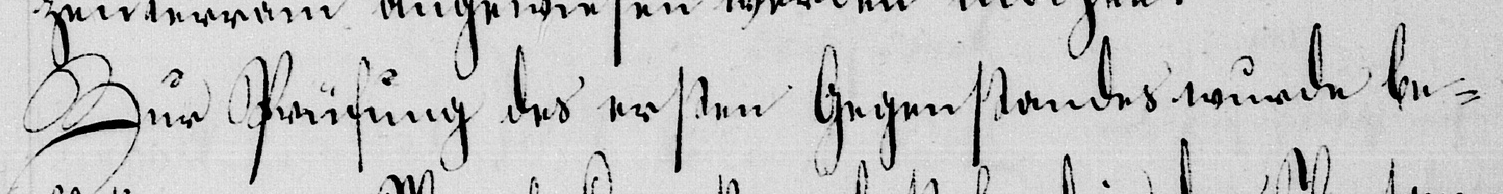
Zur Prüfung des ersten Gegenstandes wurde be¬
